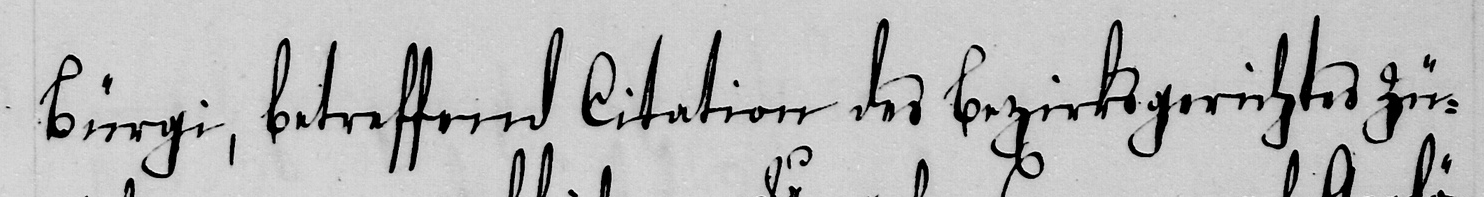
Bürgi, betreffend Citation des Bezirksgerichtes Zü¬
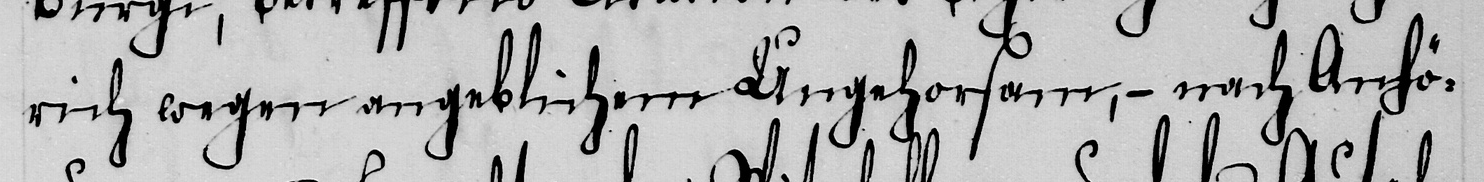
rich wegen angeblichem Ungehorsam, – nach Anhö¬
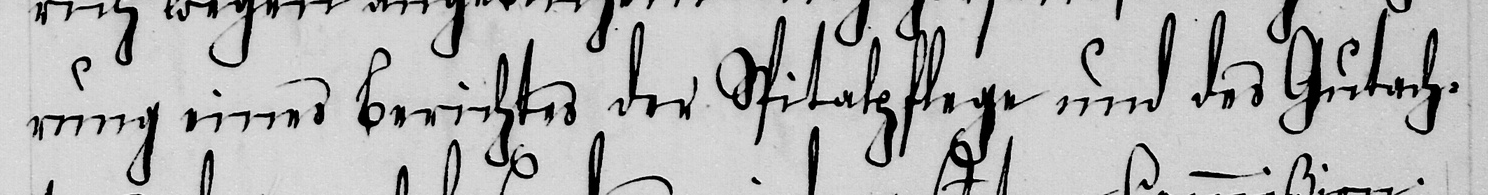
rung eines Berichtes der Spitalpflege und des Gutach¬
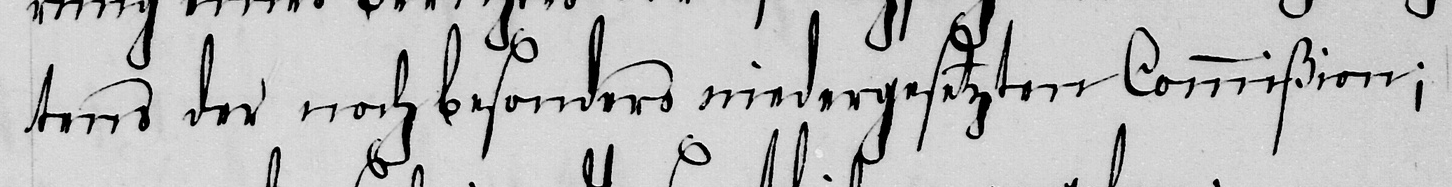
tens der noch besonders niedergesetzten Commißion;
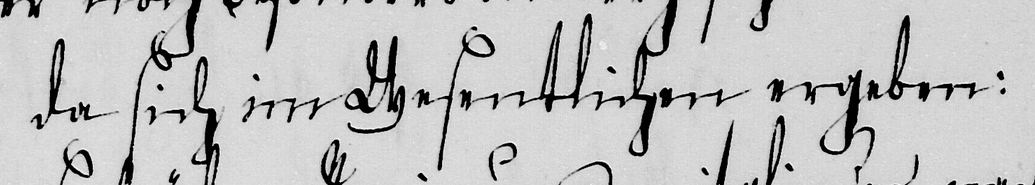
da sich im Wesentlichen ergeben:
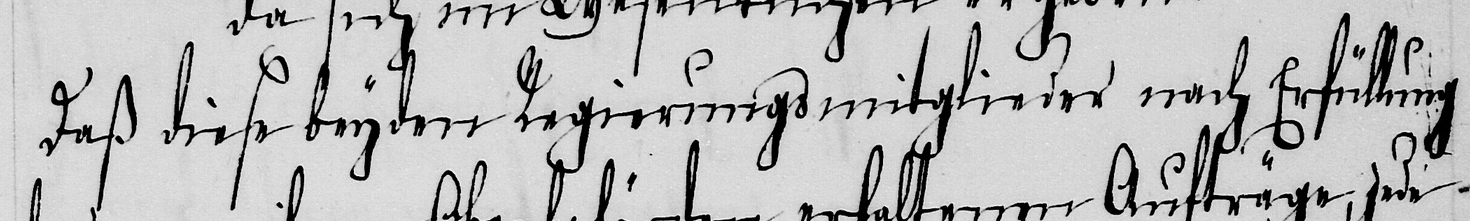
Daß diese beyden Regierungsmitglieder nach Erfüllung
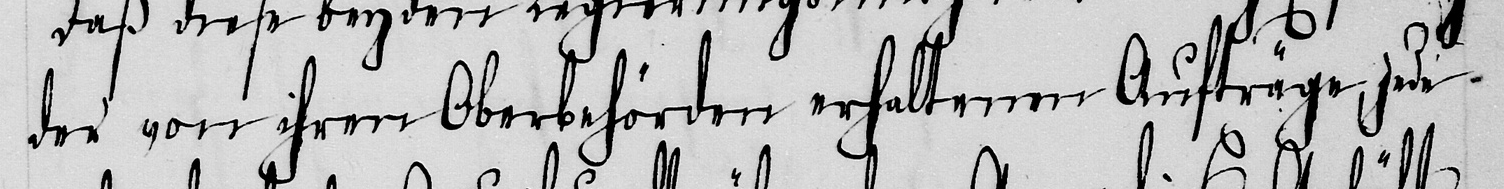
der von ihren Oberbehörden erhaltenen Aufträge, jede
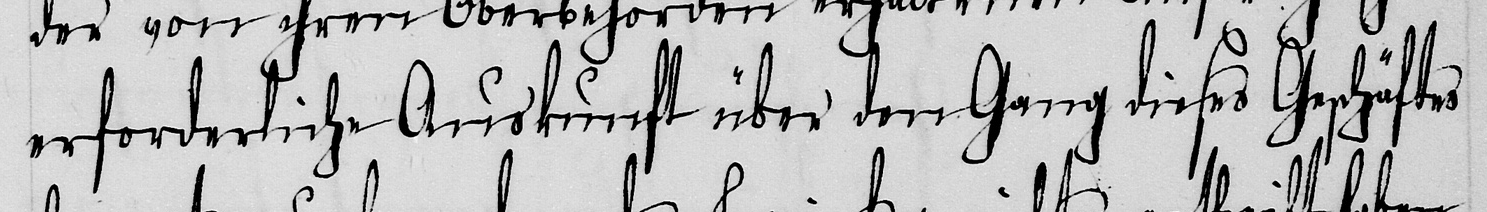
erforderliche Auskunft über den Gang dieses Geschäft¬
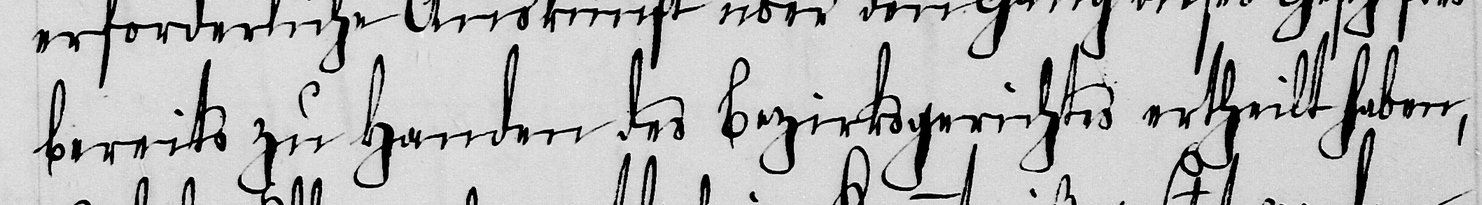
bereits zu Handen des Bezirksgerichtes ertheilt haben,
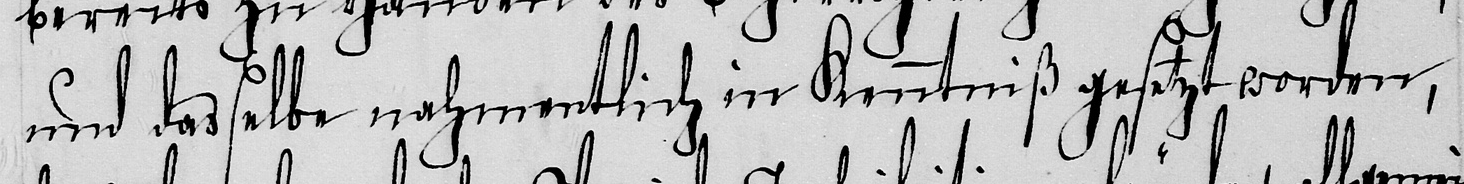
und dasselbe nahmentlich in Kenntniß gesetzt worden,
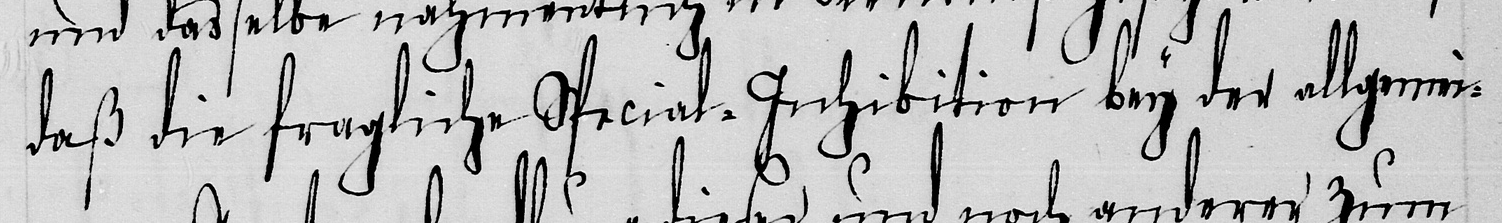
daß die fragliche Special-Inhibition bey der allgeme¬
